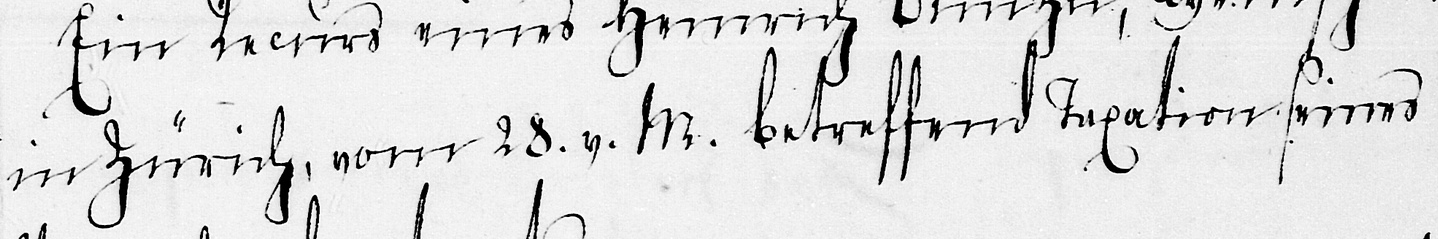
in Zürich, vom 28. v. M. betreffend Taxation seines
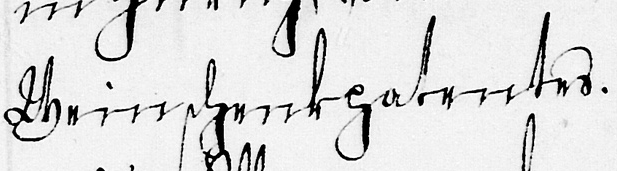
Weinschenkpatentes.
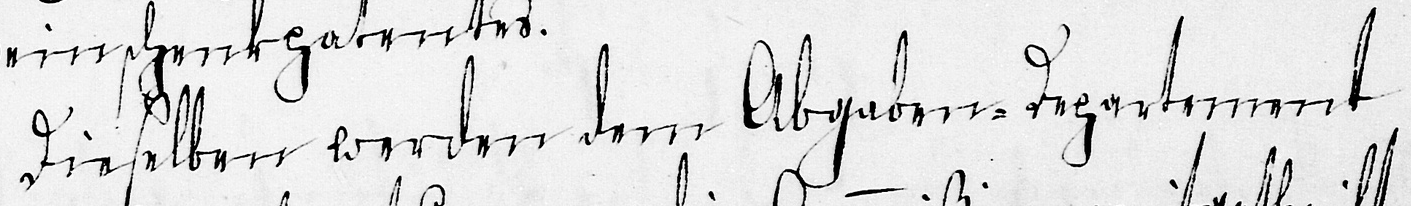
Dieselben werden dem Abgaben-Departement
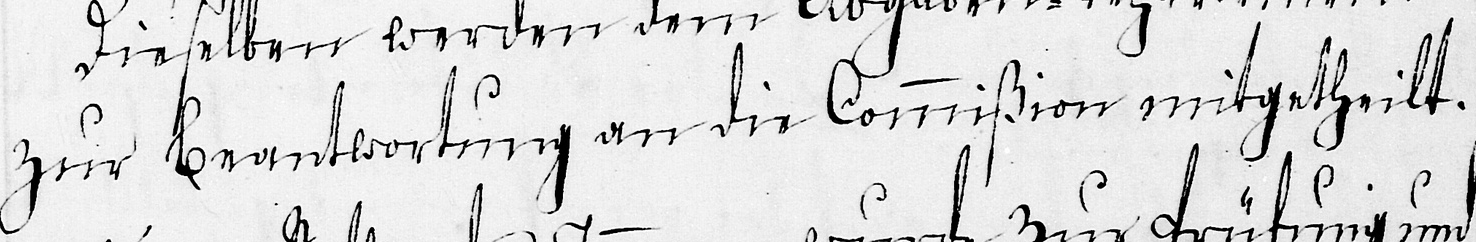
zur Beantwortung an die Commißion mitgetheilt.
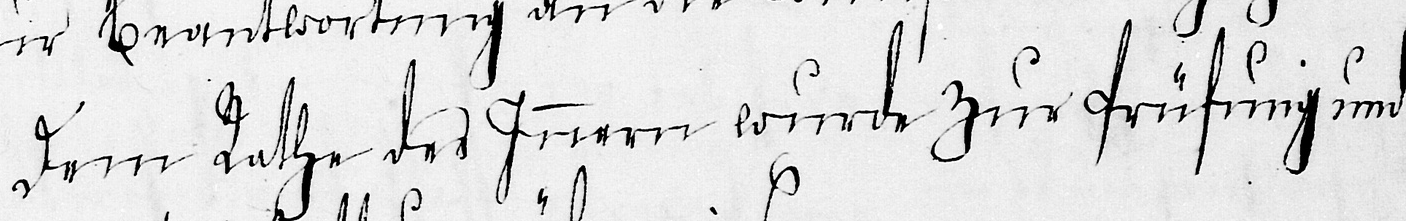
Dem Rathe des Innern wurde zur Prüfung und
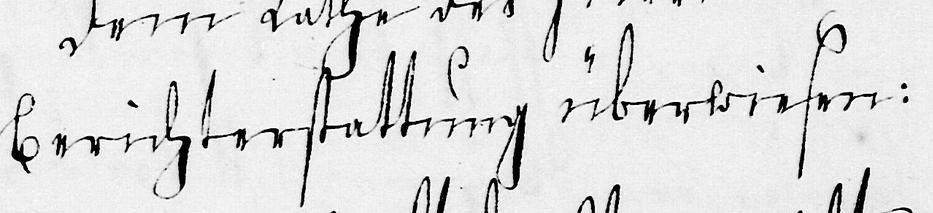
Berichterstattung überwiesen:
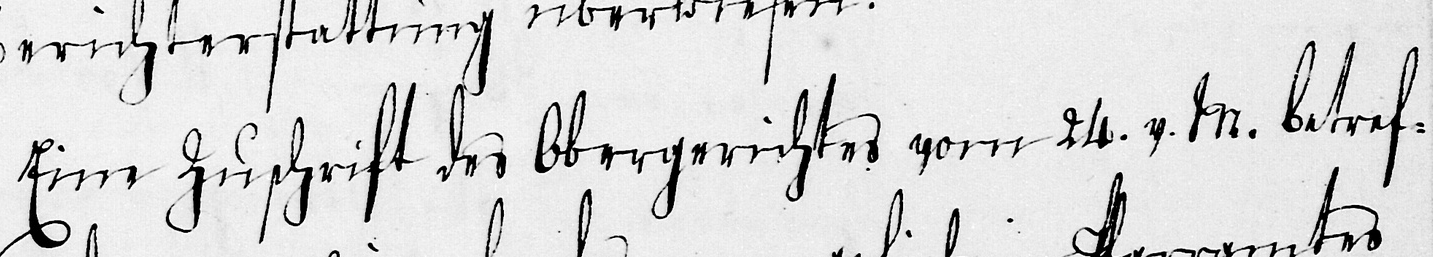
Eine Zuschrift des Obergerichtes vom 24. v. M. betref¬
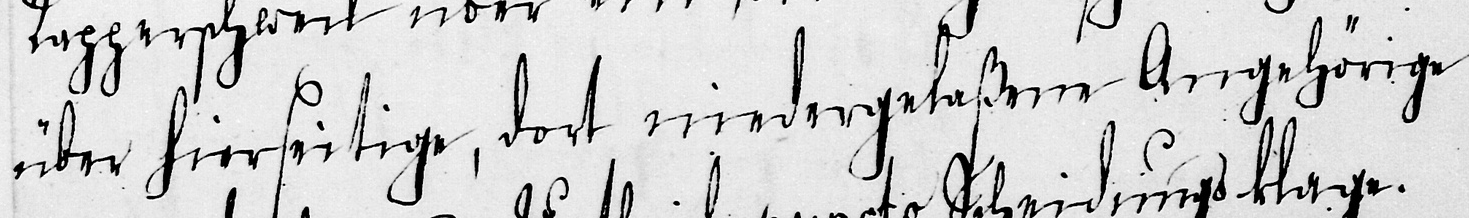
über hierseitige, dort niedergelaßene Angehörige
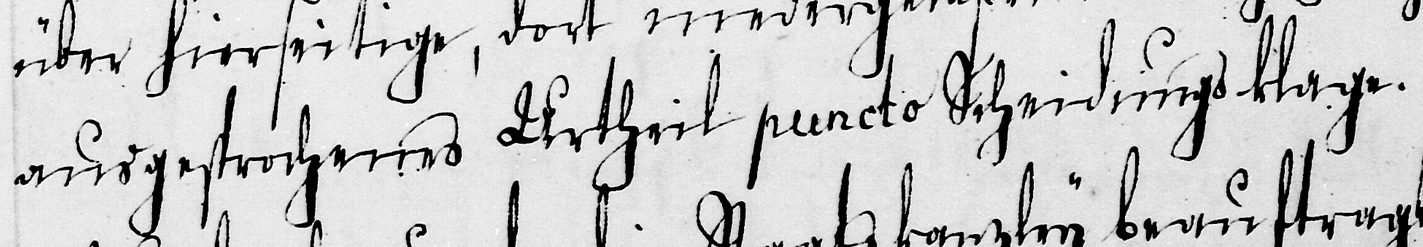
ausgesprochenes Urtheil puncto Scheidungsklage.
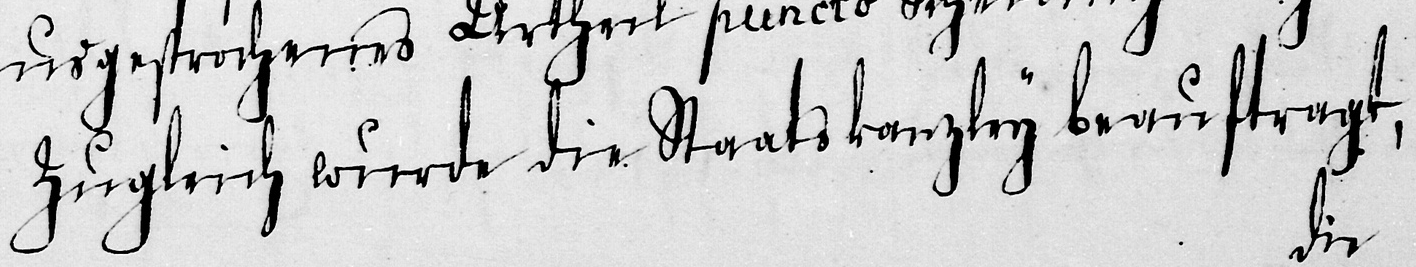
Zugleich wurde die Staatskanzley beauftragt,
